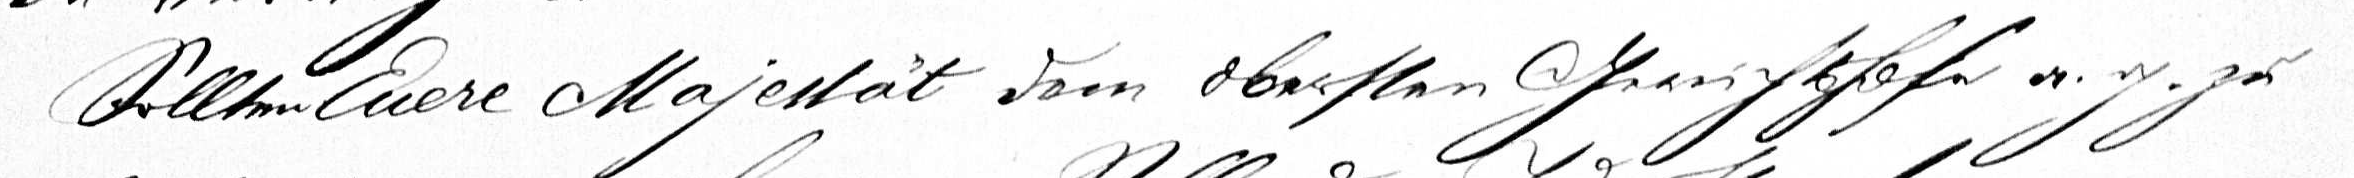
Sollten Euere Majestät dem obersten Gerichtshofe a. g. zu
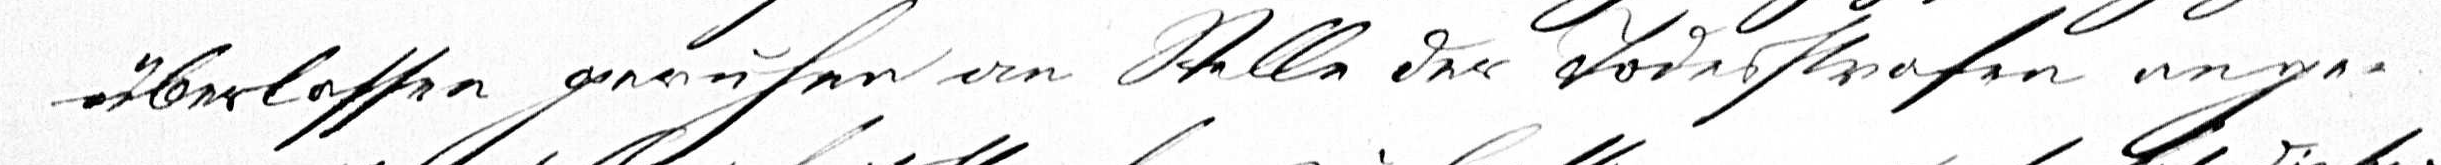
überlassen geruhen an Stelle der Todesstrafen ange¬
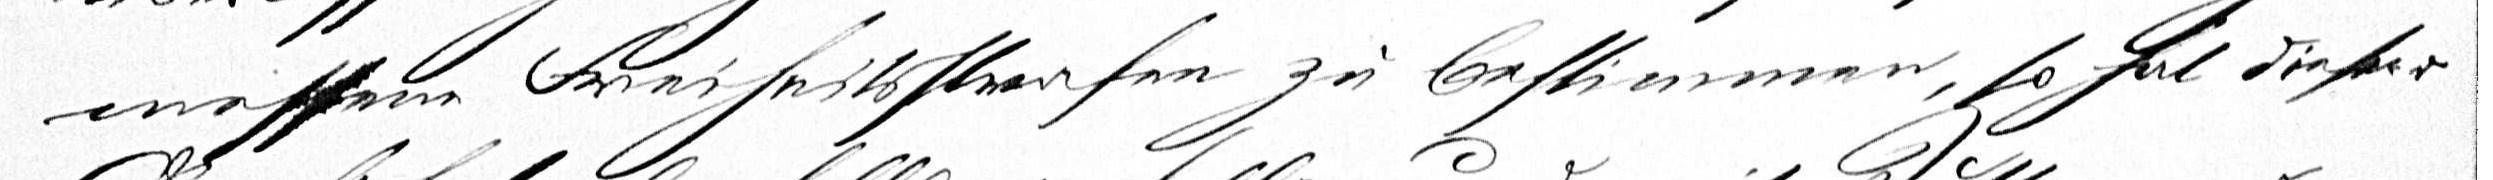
messene Freiheitsstrafen zu bestimmen, so hat dieser
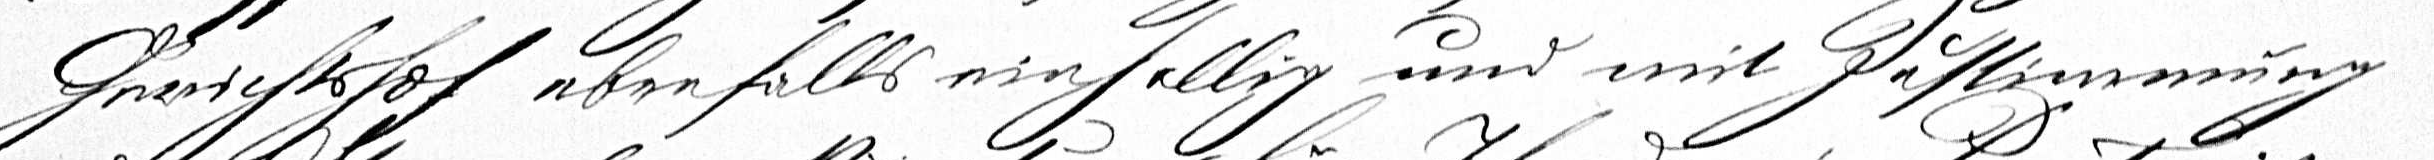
Gerichtshof ebenfalls einhellig und mit Zustimmung
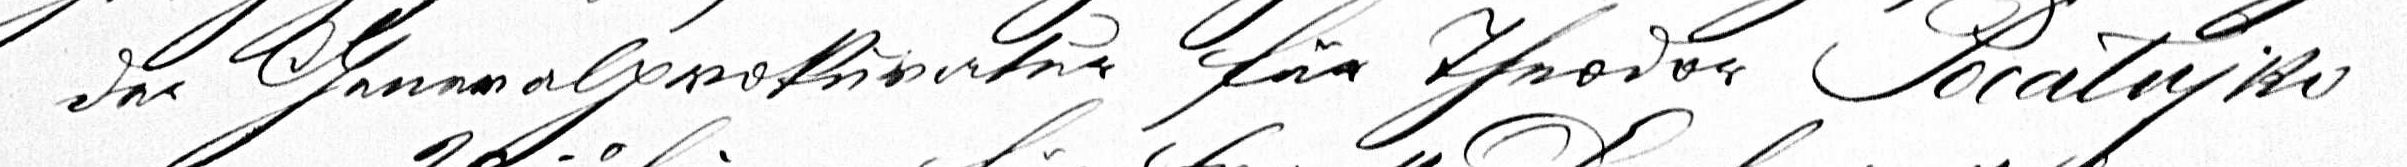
der Generalprokuratur für Theodor Pocatujko
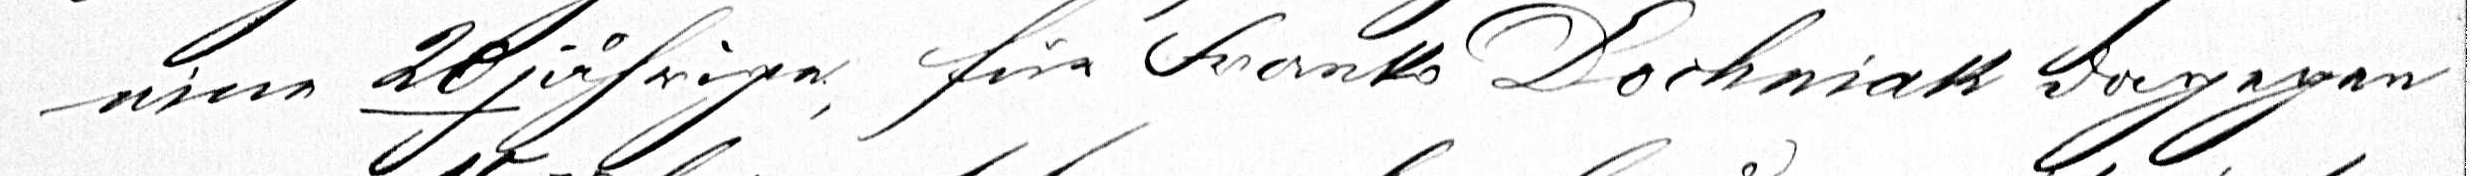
eine 20jährige, für Franko Dochniak dagegen
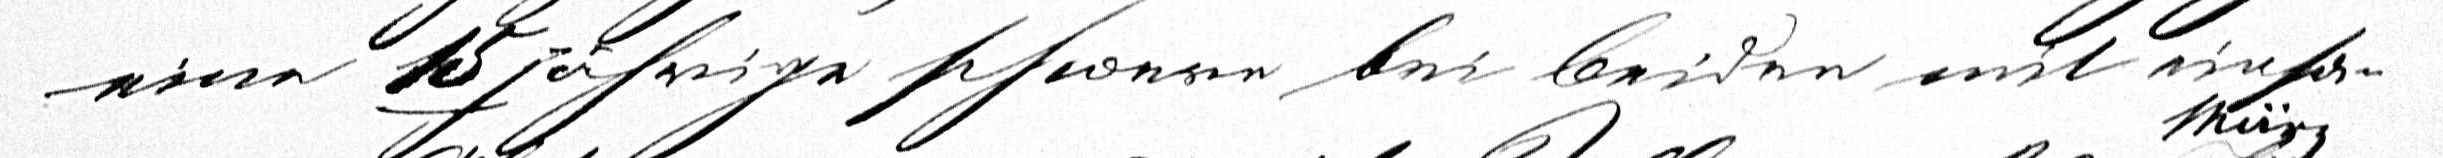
eine 15jährige schwere bei beiden mit einsa¬
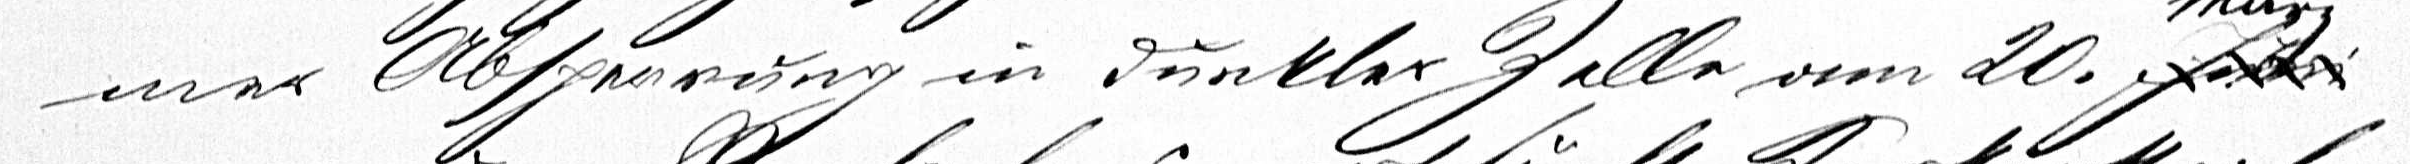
mer Absperrung in dunkler Zelle am 20. März
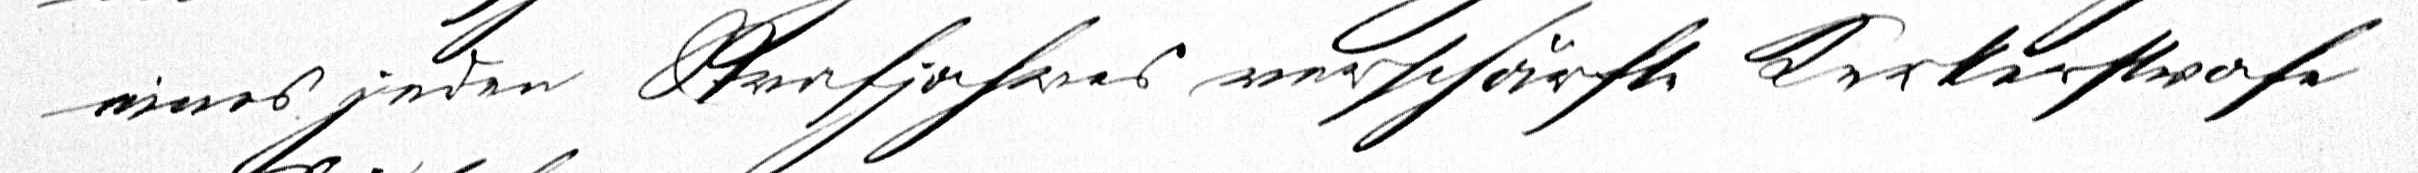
eines jeden Strafjahres verschärfte Kerkerstrafe
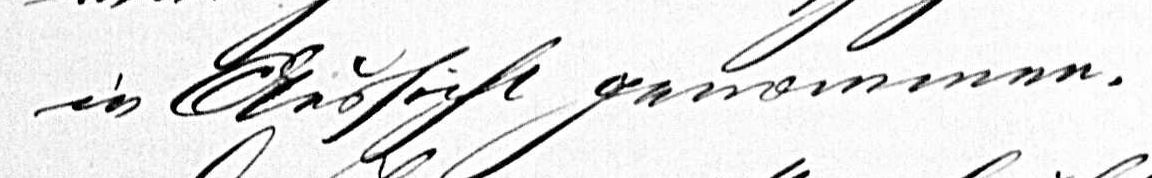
in Aussicht genommen.
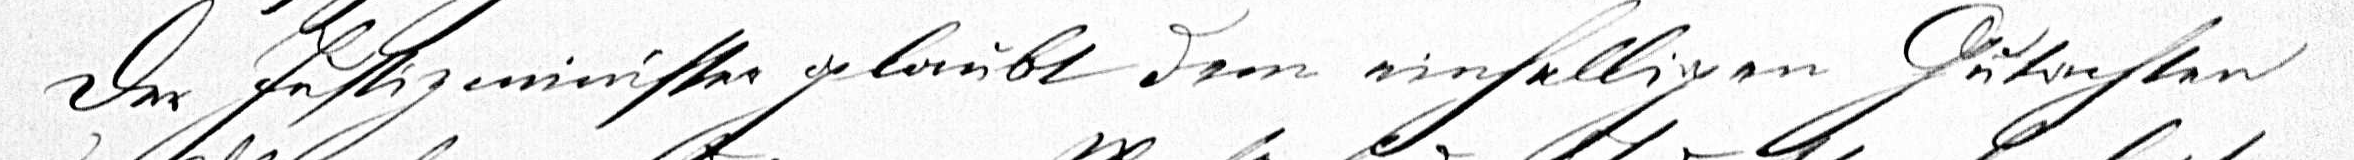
Der Justizminister glaubt dem einhelligen Gutachten
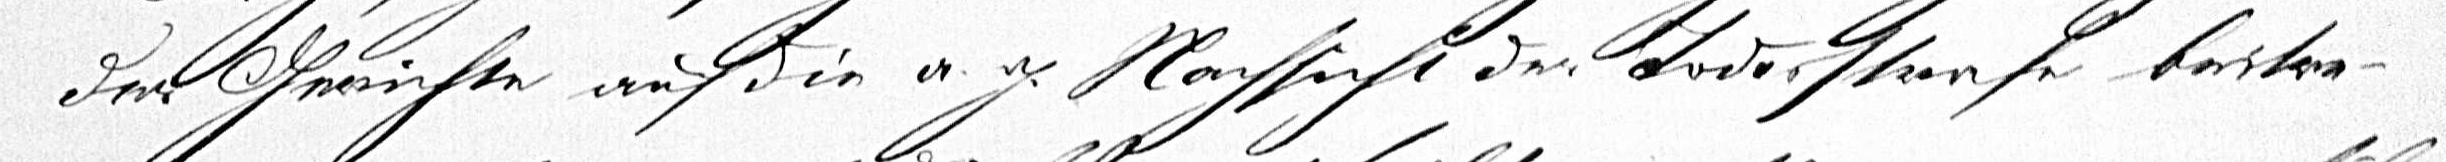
der Gerichte auf die a. g. Nachsicht der Todesstrafe beitre¬
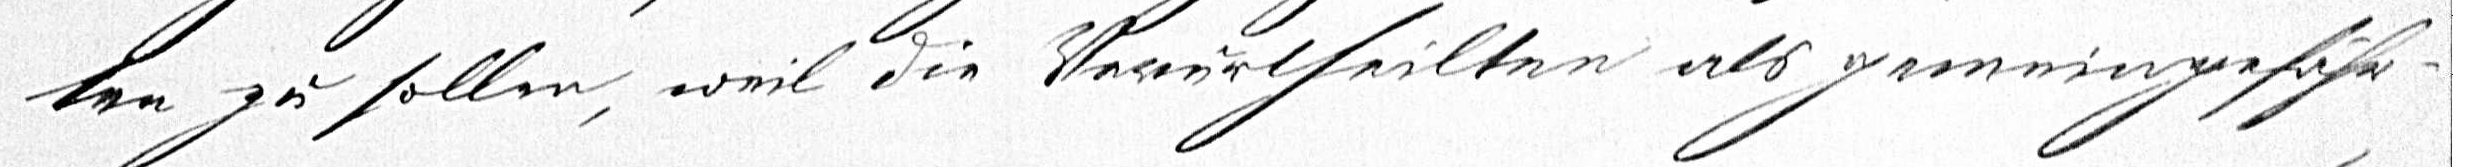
ten zu sollen, weil die Verurtheilten als gemeingefähr¬
